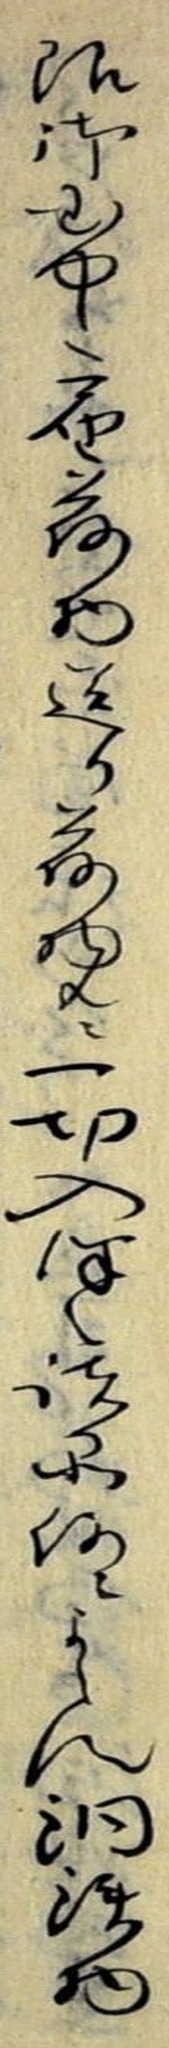限御国中へ届荷物送り荷物共ニ一切入津之諸品何ニよらす銅鉄物
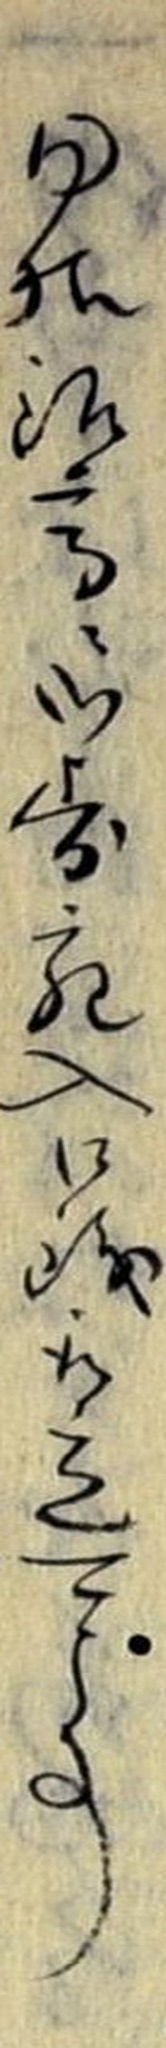同様銀高ニ弐歩宛入口銭取立可申事
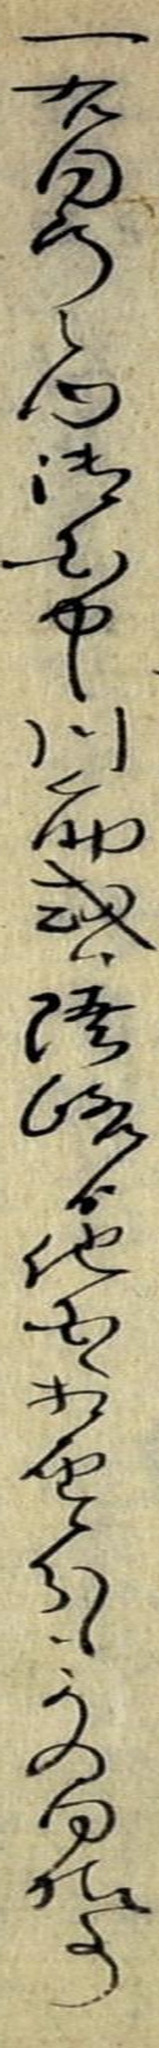一右同断之内御国中川筋或ハ陸路ゟ他国へ相届候分も可為同様事
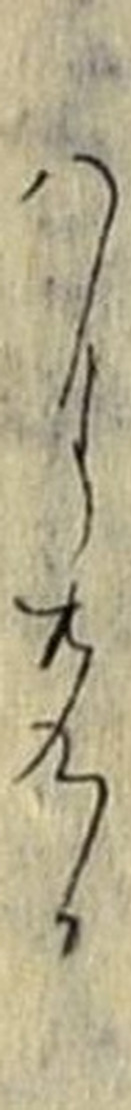八月廿九日
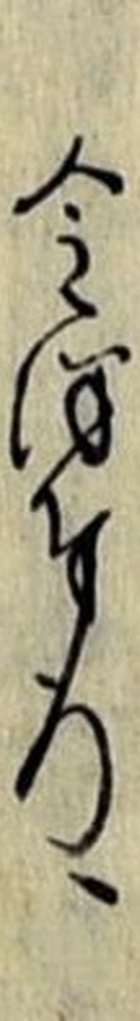金津奉行へ
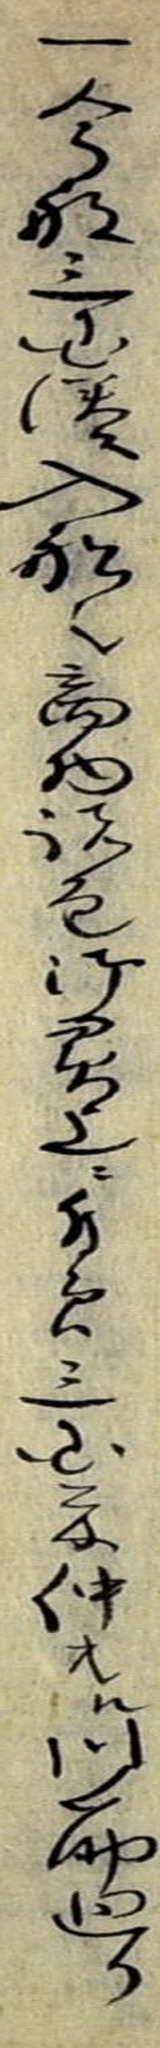一今般三国湊へ入船之商物諸色買上ニ付而ハ三国米仲共江川筋廻り
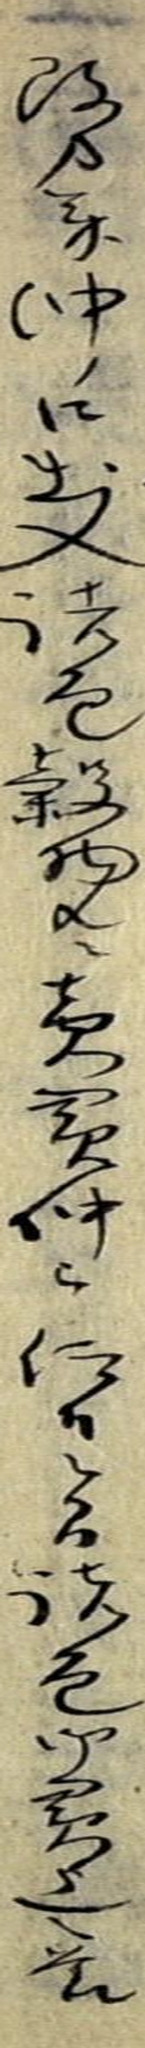改方并沖ノ口出入諸色穀物共ニ売買仲被仰付候間諸色御買上之節
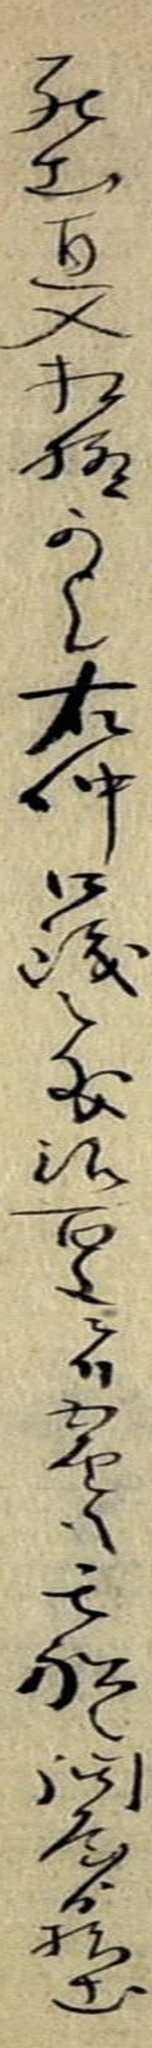罷出直入相極可申候右仲口銭之義銀百匁ニ付五厘ツヽ其船之問屋ゟ指出
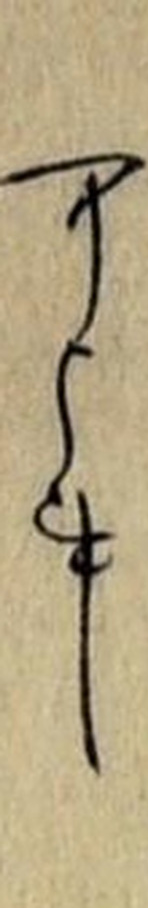可申事
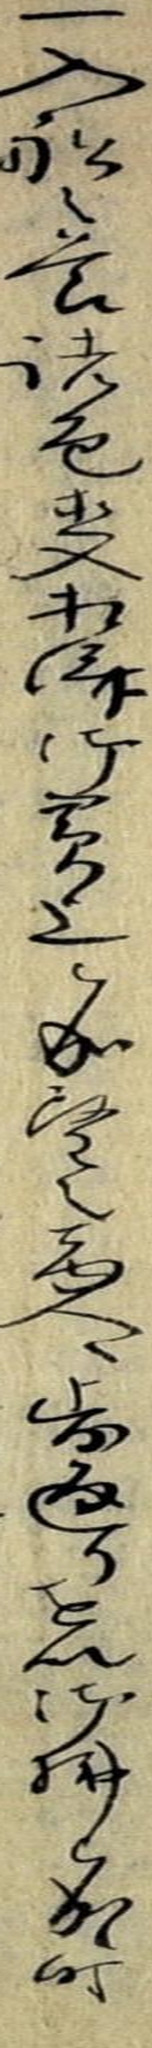一入船之節諸色直入相済御買上被成望之商人へ歩通りを以御払被成候時
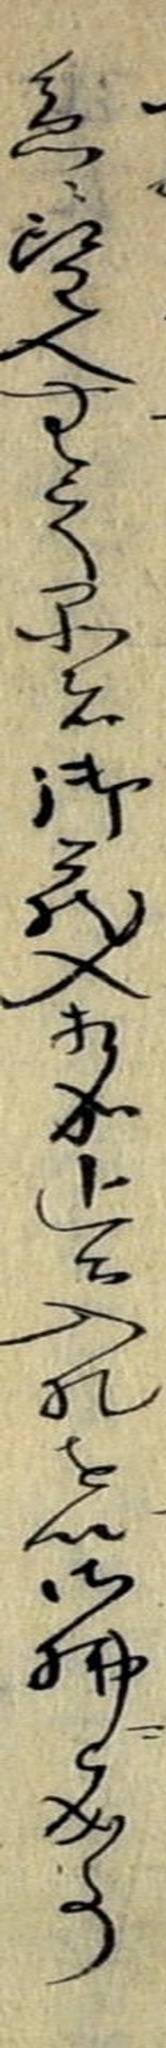急ニ望人無之品者御蔵入相成追而入札を以御払被成事
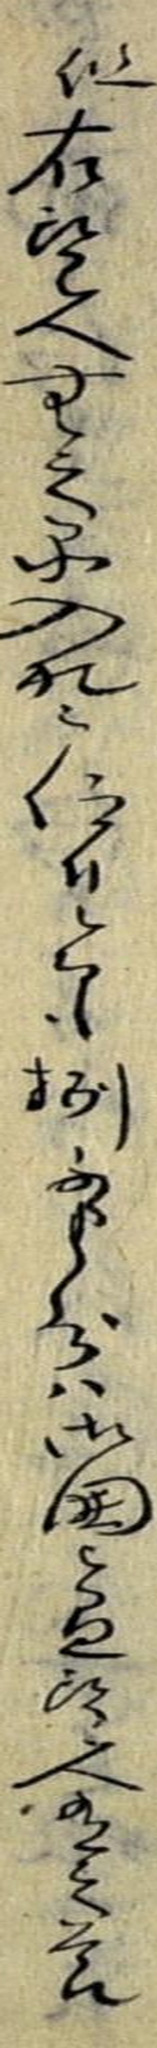但右望人無之品入札被仰付候而も捌不申分ハ御囲被置望人有之節
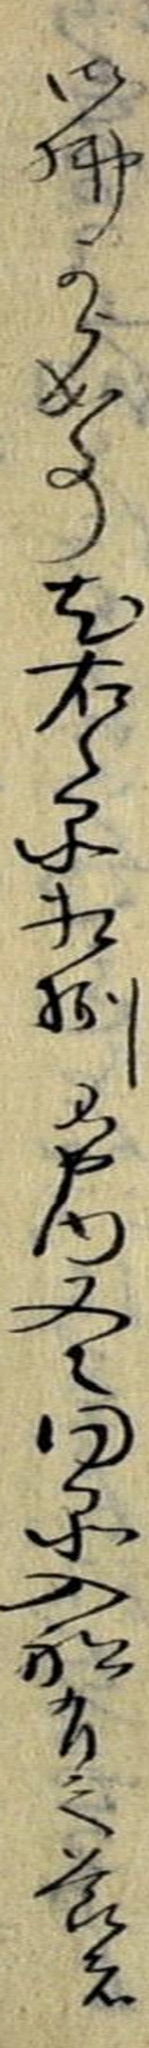御払可被成事尤右之品相捌不申内又々同品入船有之節者
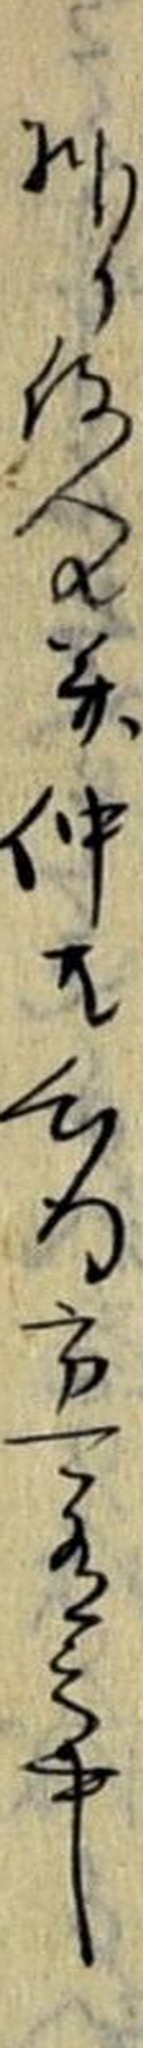掛り役人共并仲共心得方可有之事
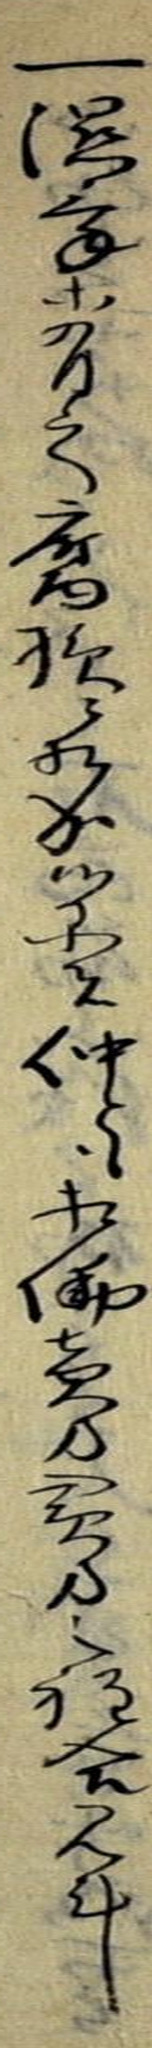一湿気等有之腐様ニ相成候品者仲とも相働売方買方之程合見計
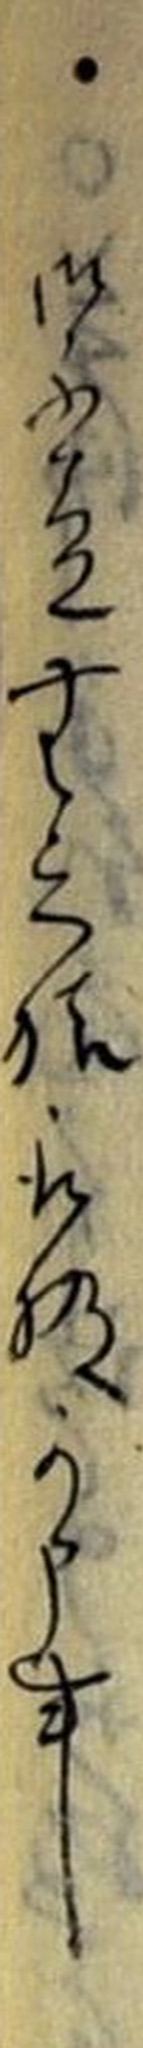御不益無之様取扱可申事
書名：命令之部 三
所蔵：福井県文書館 Fukui Prefectural Archives
